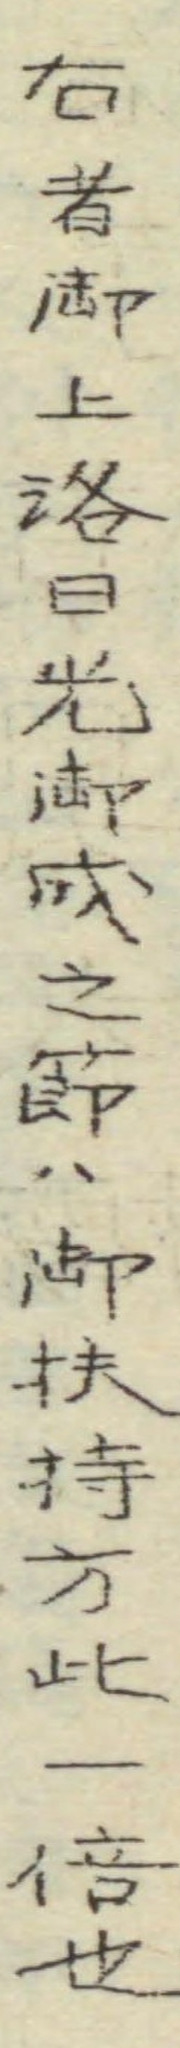右者御上洛日光御成之節ハ御扶持方此一倍也
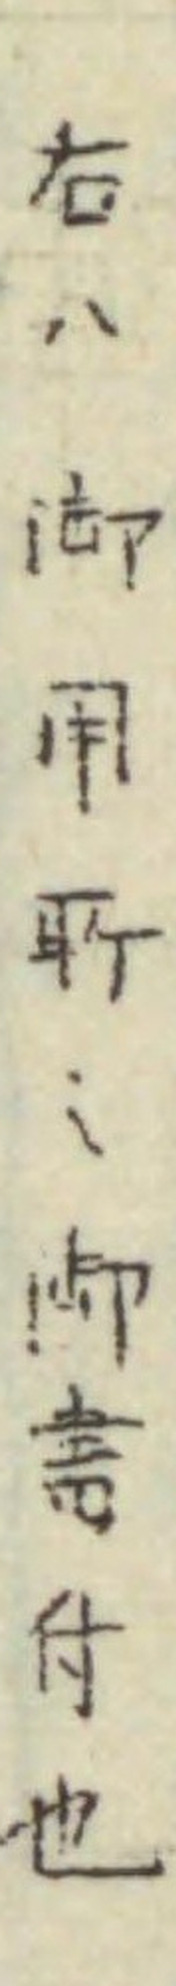右ハ御用所之御書付也
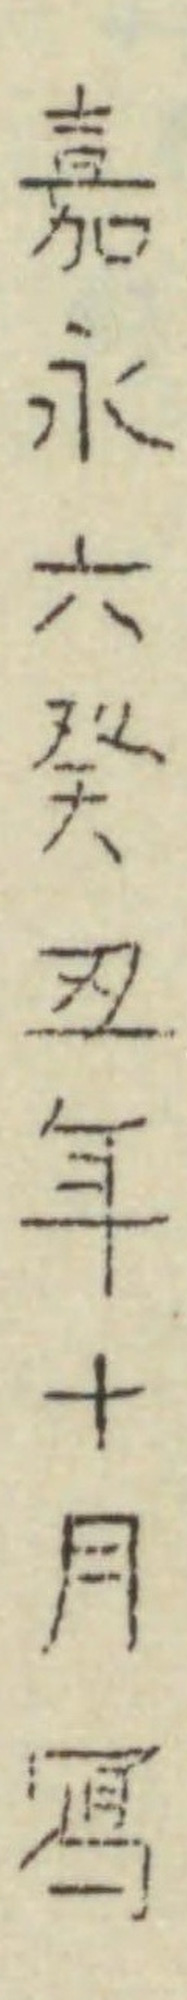嘉永六癸丑年十月写

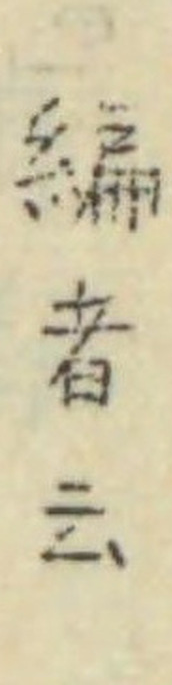編者云
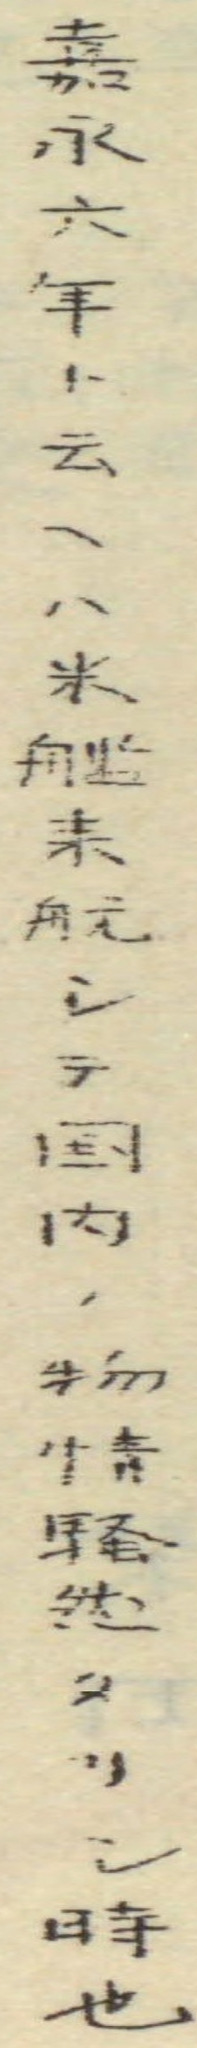嘉永六年ト云へハ米艦来航シテ国内ノ物情騒然タリシ時也
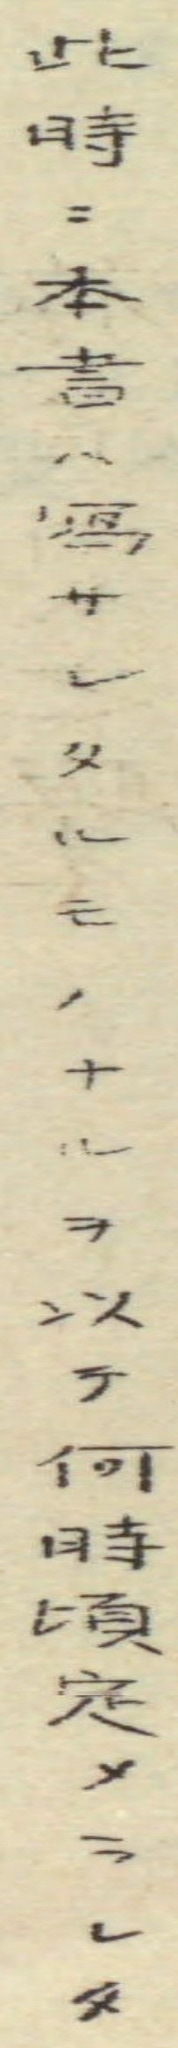此時二本書ハ写サレタルモノナルヲ以テ何時頃定メラレタ
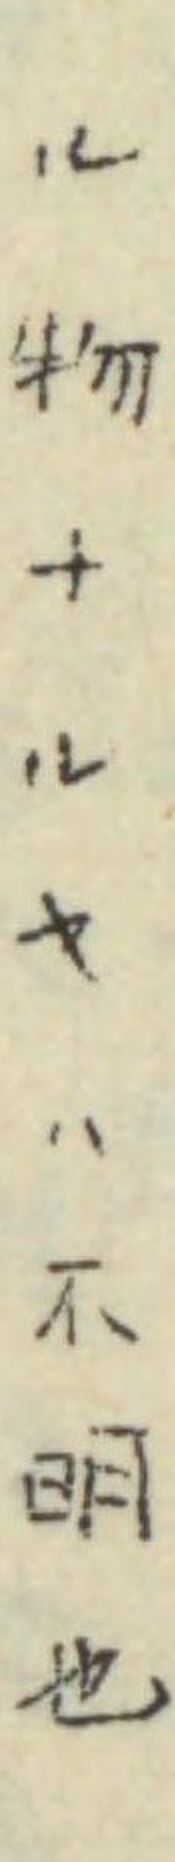ル物ナルヤハ不明也
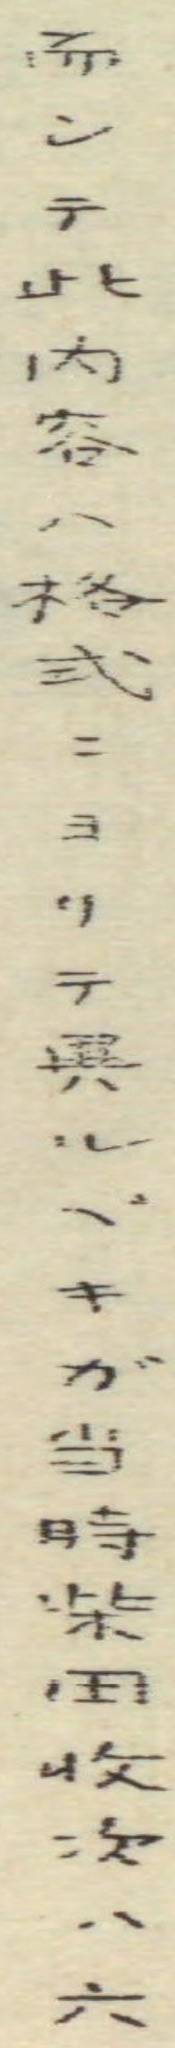而シテ此内容ハ格式二ヨリテ与ルベキガ当時柴田収次ハ六
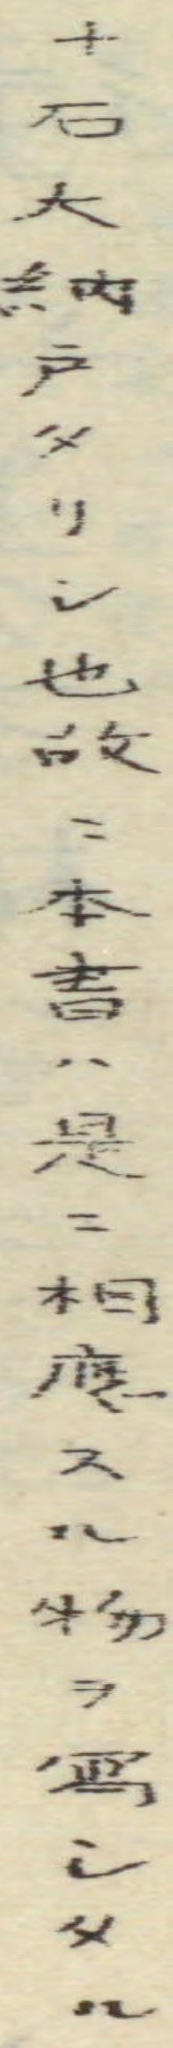十石大納戸タリシ也故ニ本書ハ是二相応スル物ヲ写シタル
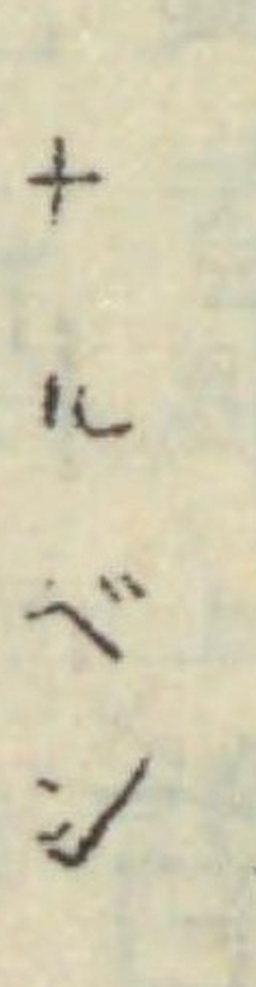ナルベシ
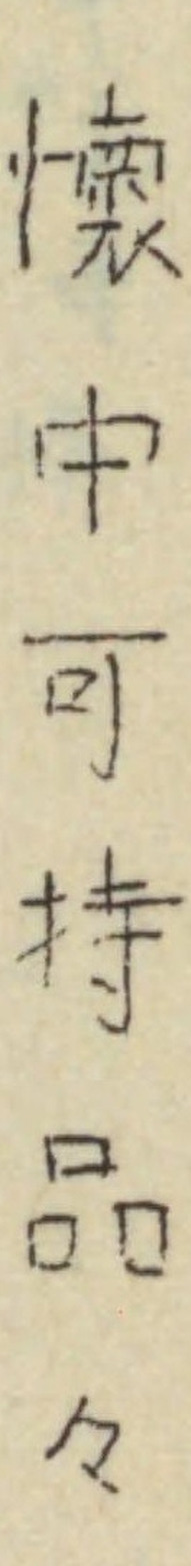懐中可持品々
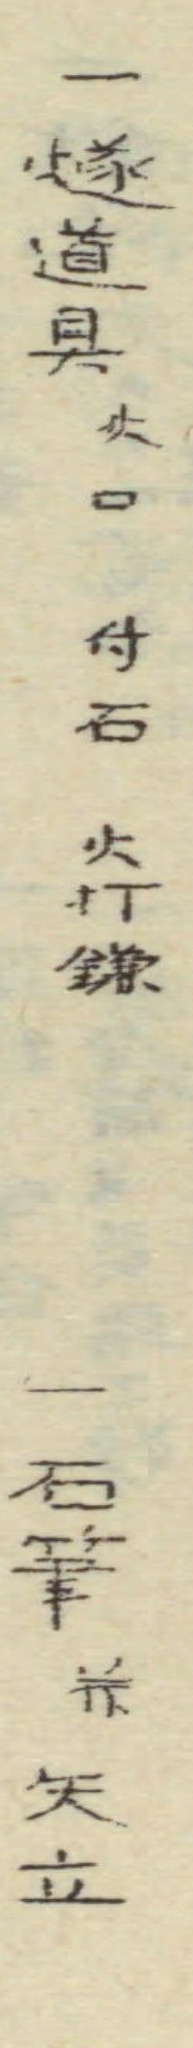一燧道具火口付口火打鎌一石筆并矢立
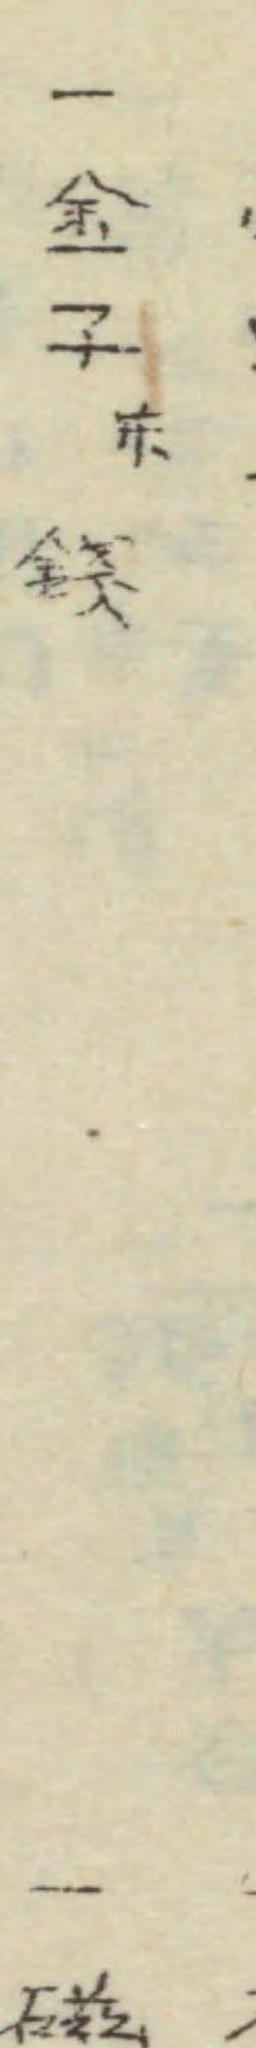一金子并銭一磁石
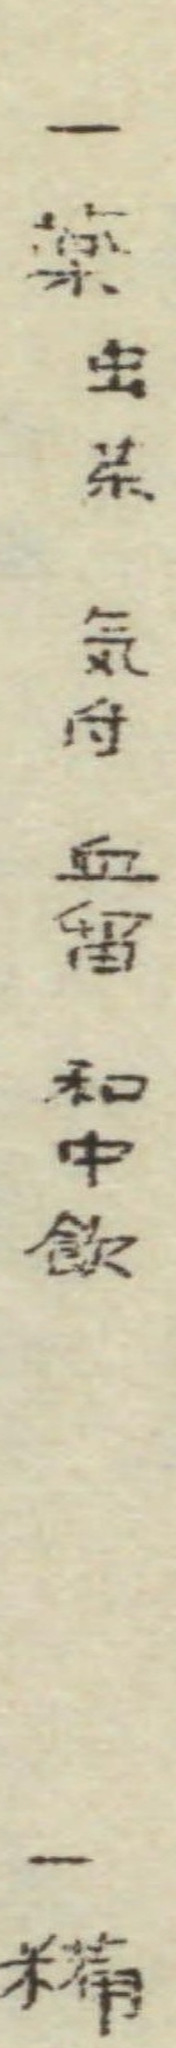一薬虫薬気付血留和中飲一糒
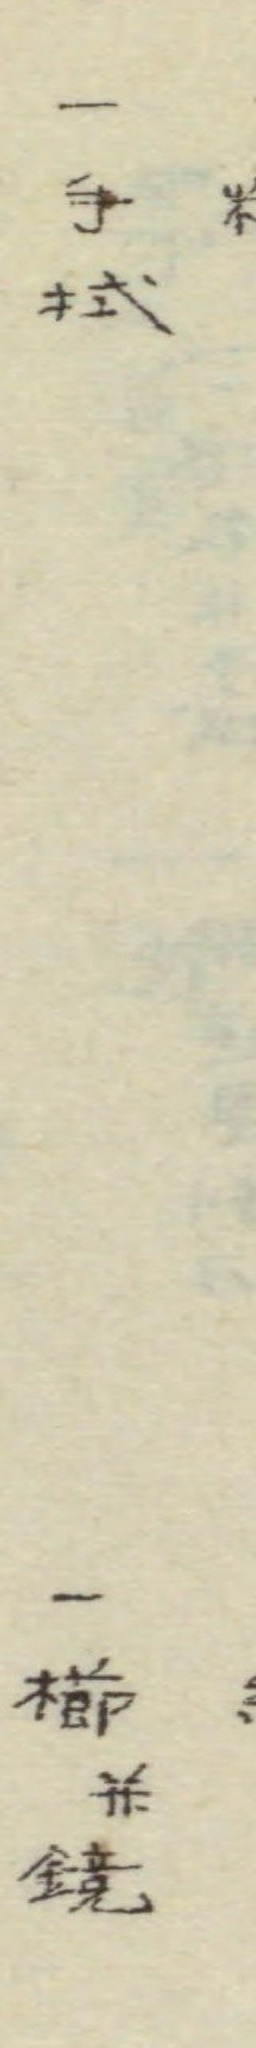一手拭一櫛并鏡
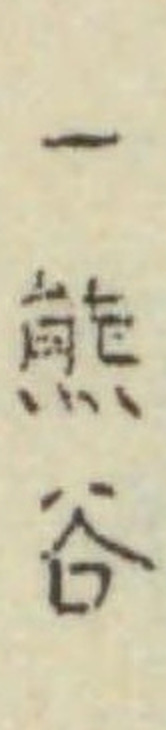一熊谷
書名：三河吉田藩動員史料
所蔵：国立国会図書館 National Diet Library, JAPAN
